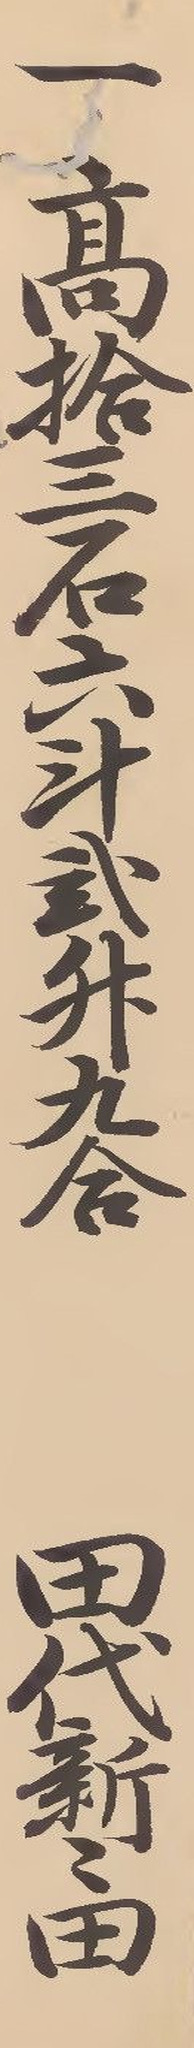一高拾三石六斗弐升九合田代新々田
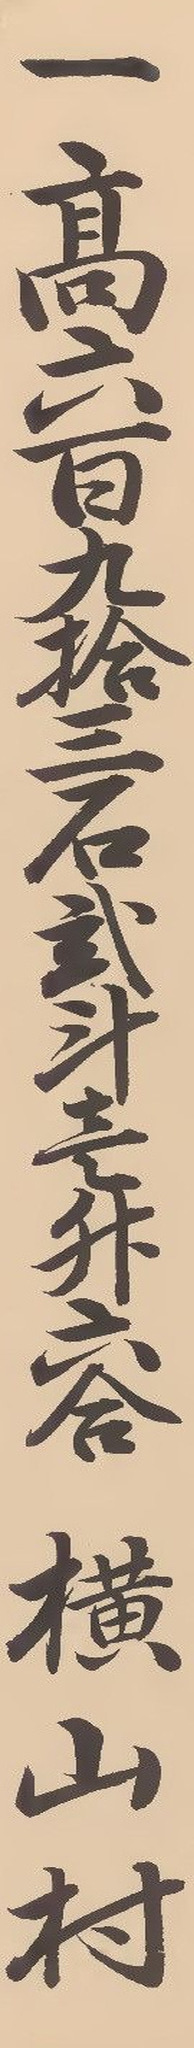一高六百九拾三石弐斗壱升六合横山村
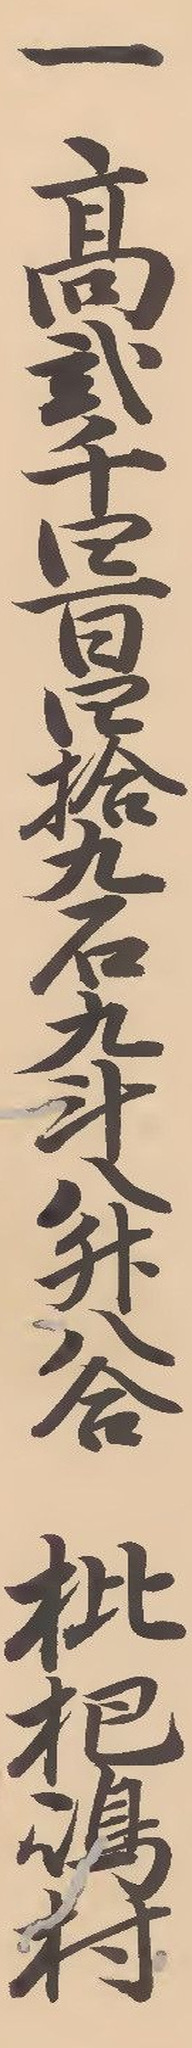一高弐千四百四拾九石九斗八升八合枇杷嶋村

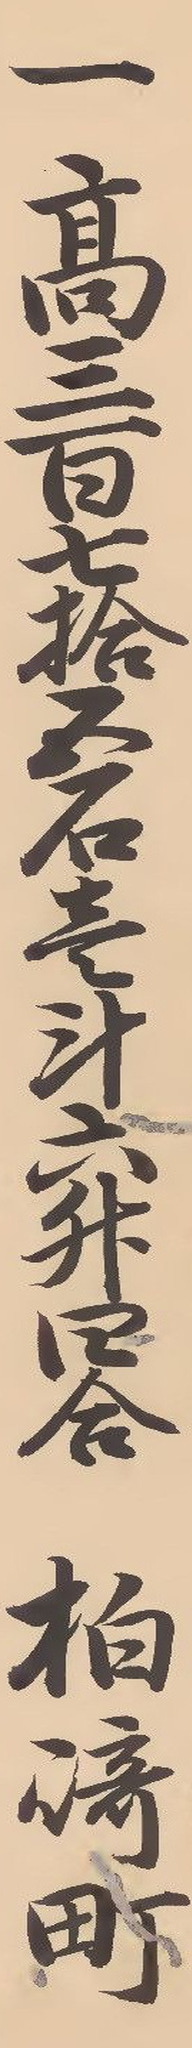一高三百七拾五石壱斗六升四合柏崎町
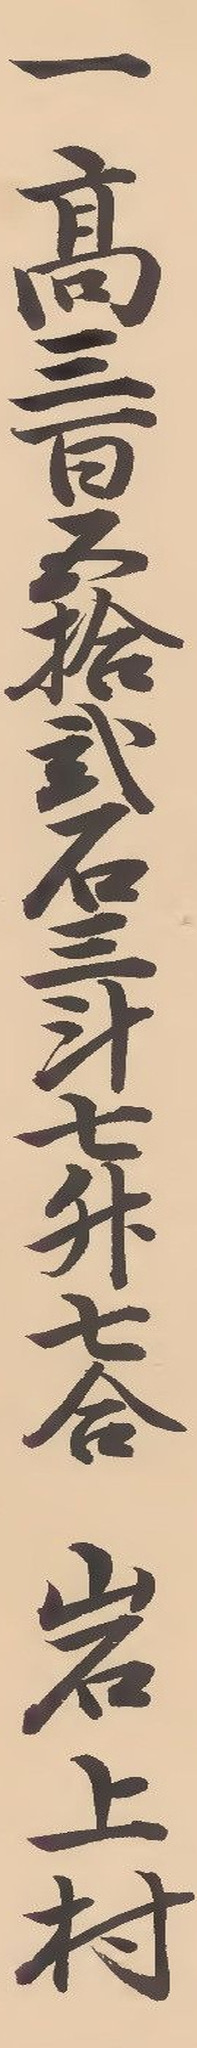一高三百五拾弐石三斗七升七合岩上村
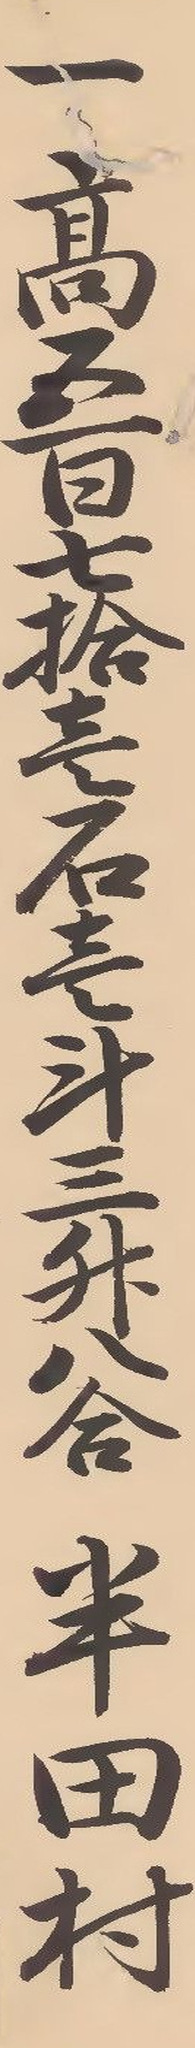一高五百七拾壱石壱斗三升八合半田村
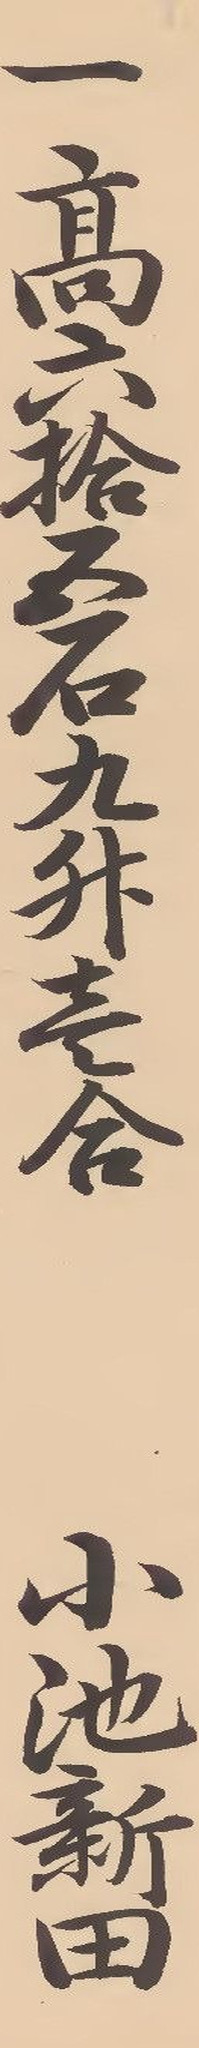一高六拾五石九升壱合小池新田
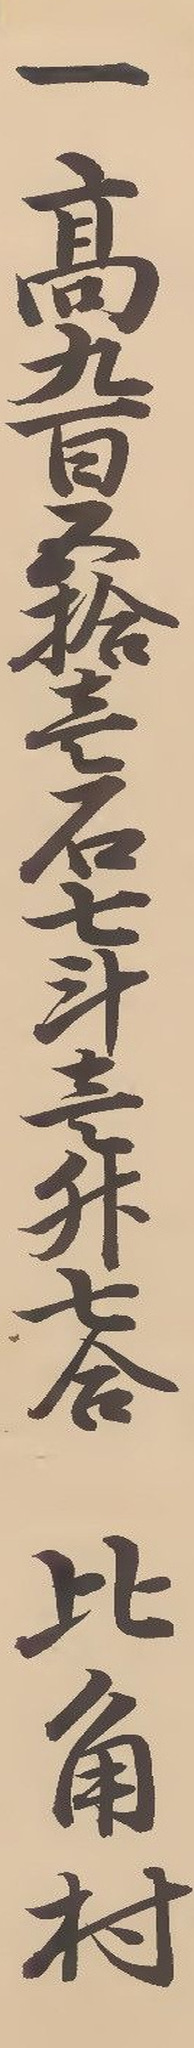一高九百五拾壱石七斗壱升七合比角村
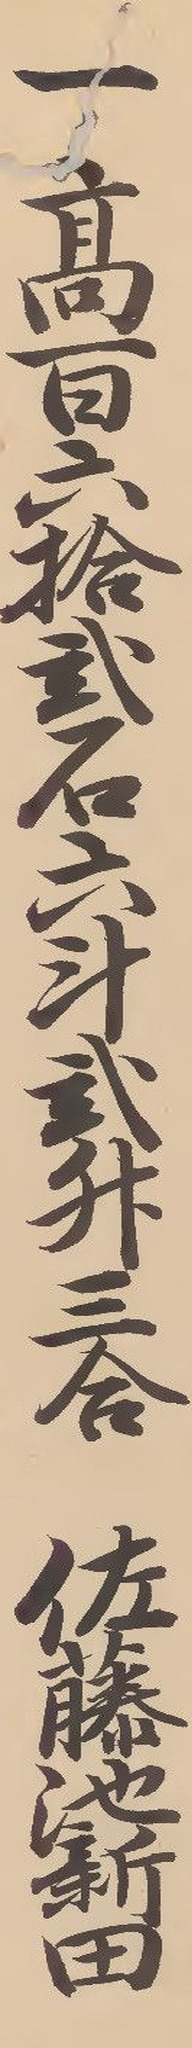一高百六拾弐石六斗弐升三合佐藤池新田
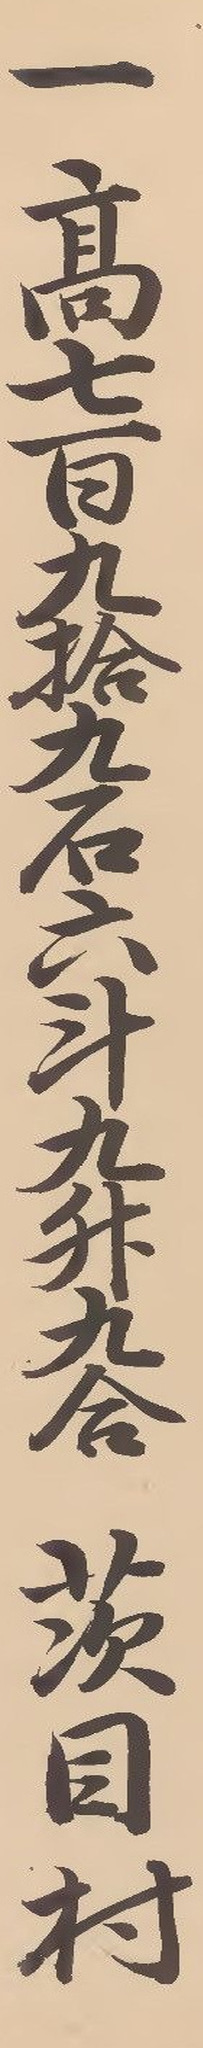一高七百九拾九石六斗九升九合茨目村
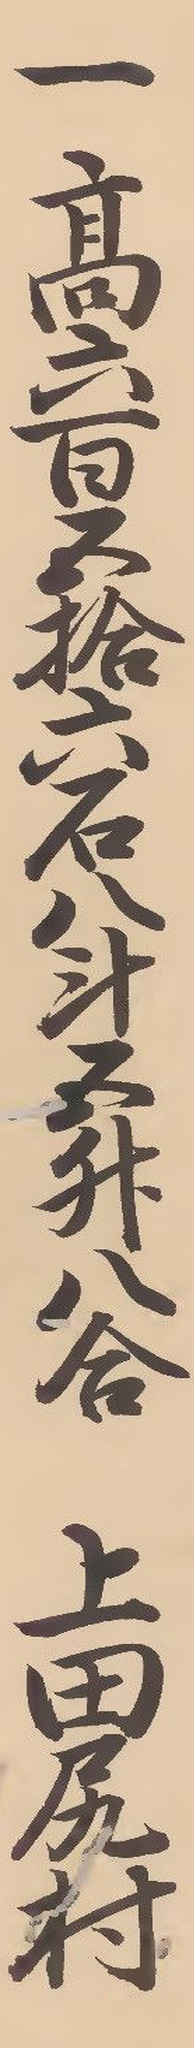一高六百五拾六石八斗五升八合上田尻村

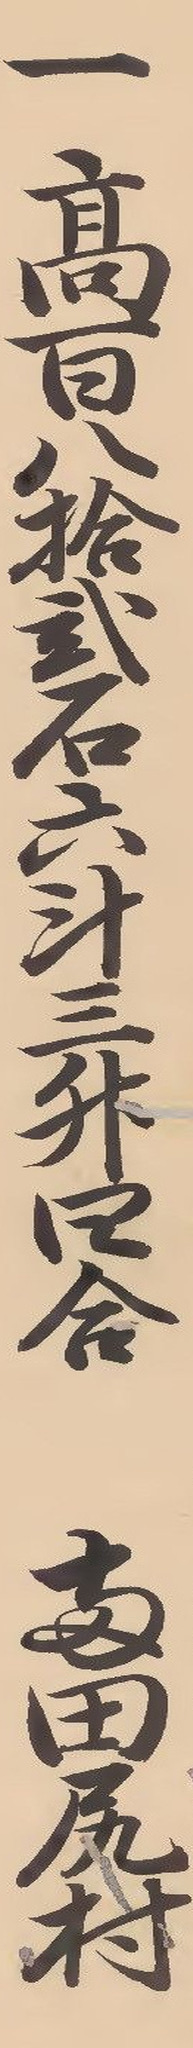一高百八拾弐石六斗三升四合両田尻村
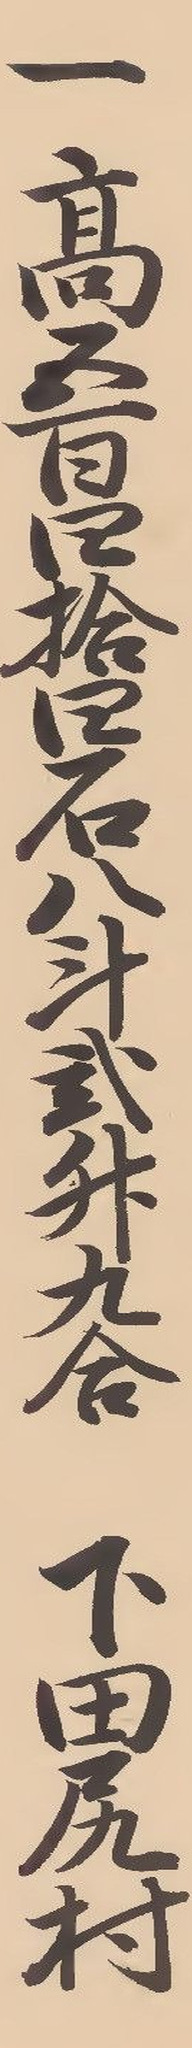一高五百四拾四石八斗弐升九合下田尻村
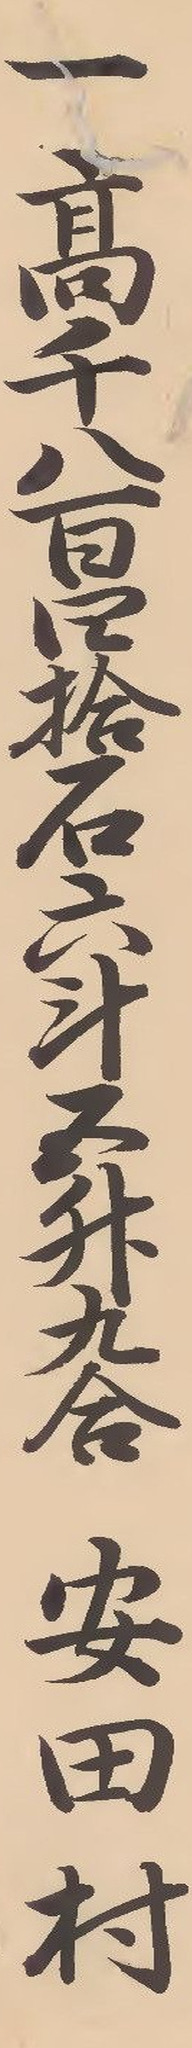一高千八百四拾石六斗五升九合安田村
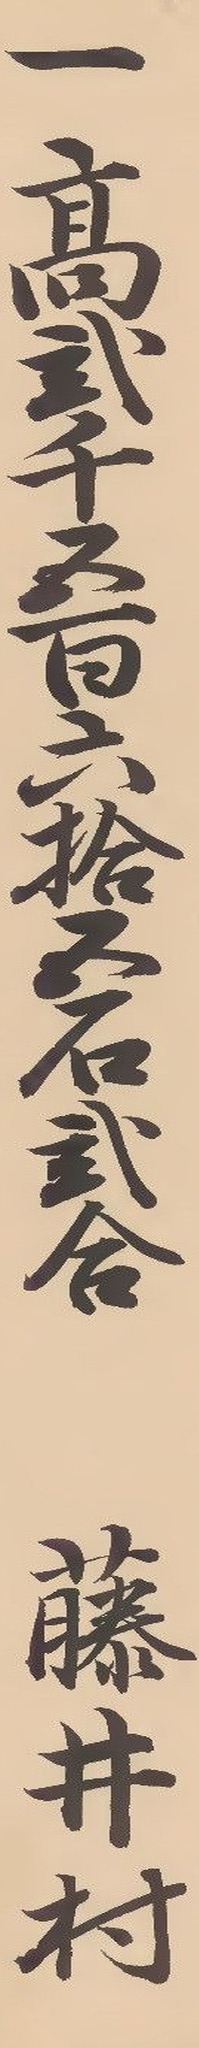一高弐千五百六拾五石弐合藤井村
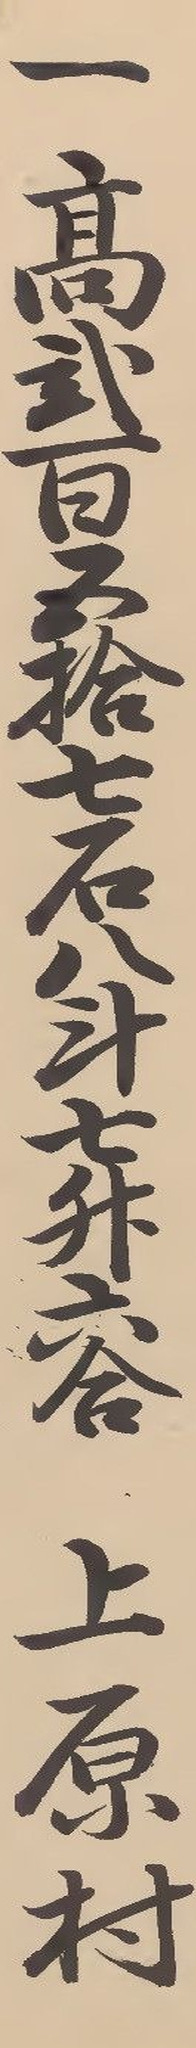一高弐百五拾七石八斗七升六合上原村
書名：越後国郷帳　中
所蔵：国立公文書館 National Archives of Japan
